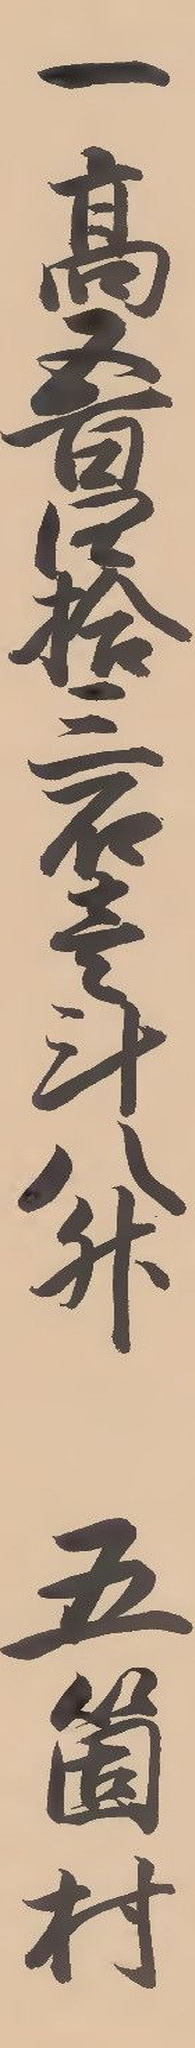一高五百四拾三石壱斗八升五箇村
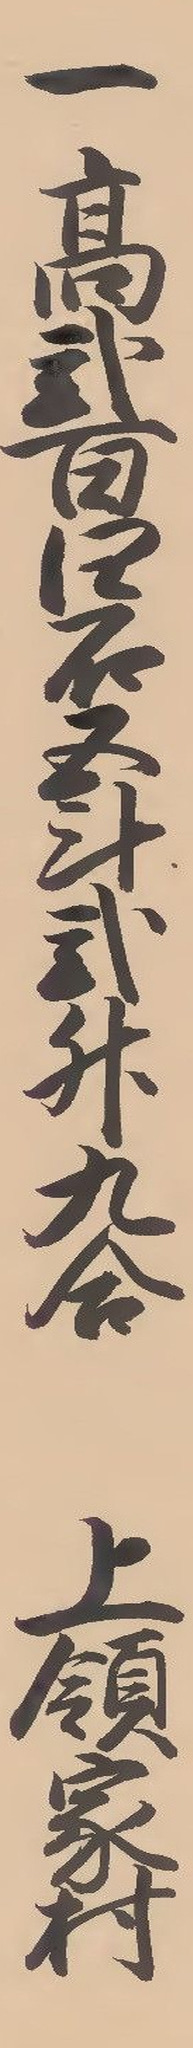一高弐百四石五斗弐升九合上領家村

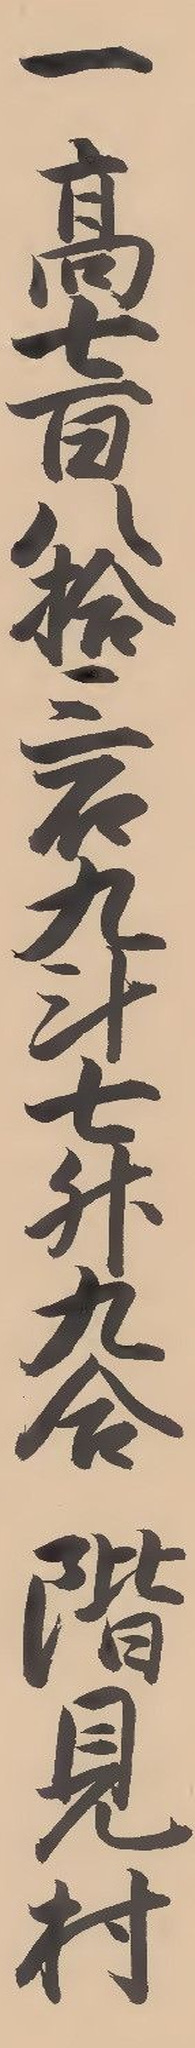一高七百八拾三石九斗七升九合階見村
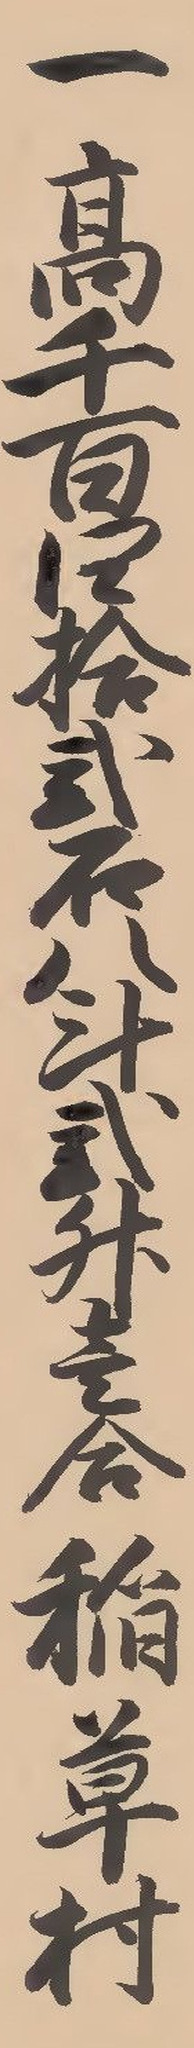一高千百四拾弐石八斗弐升壱合稲草村
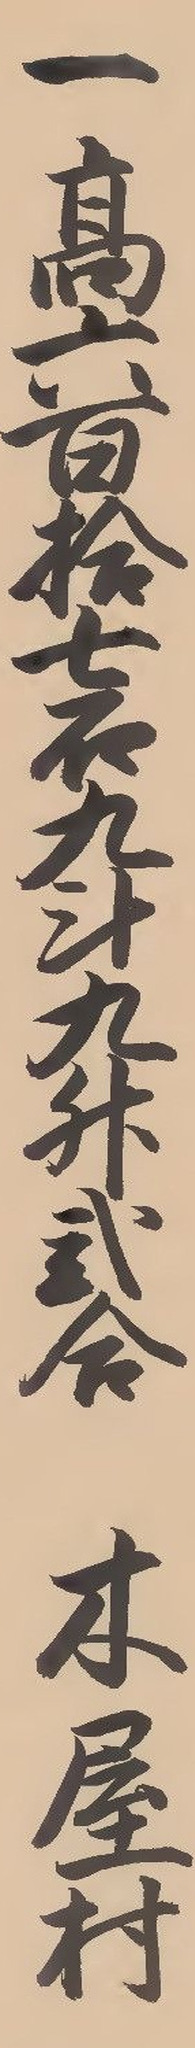一高六百拾七石九斗九升弐合木屋村
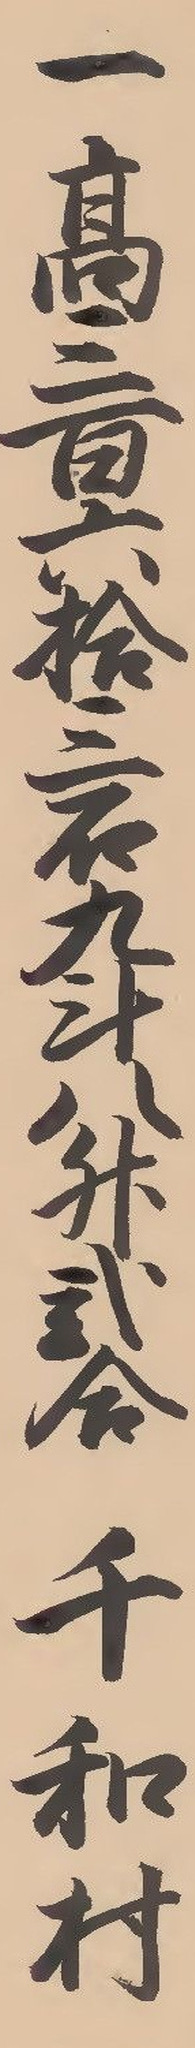一高三百六拾三石九斗八升弐合千和村
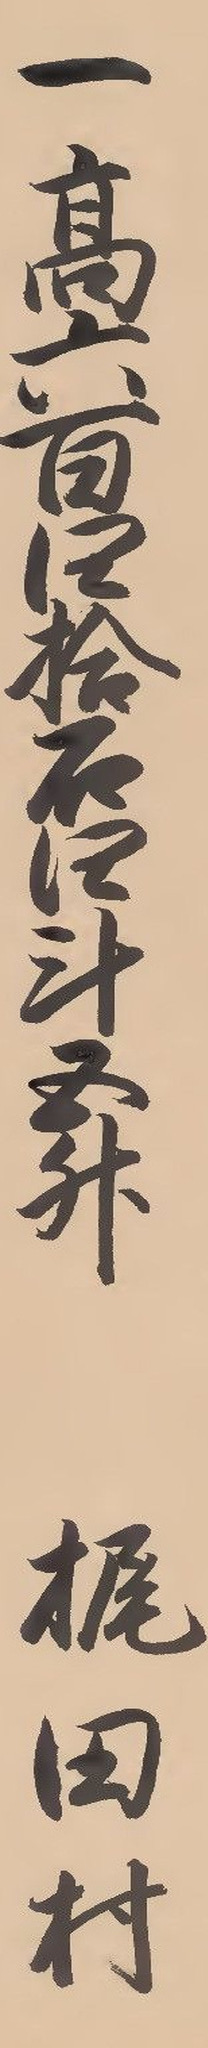一高六百四拾石四斗五升梶田村
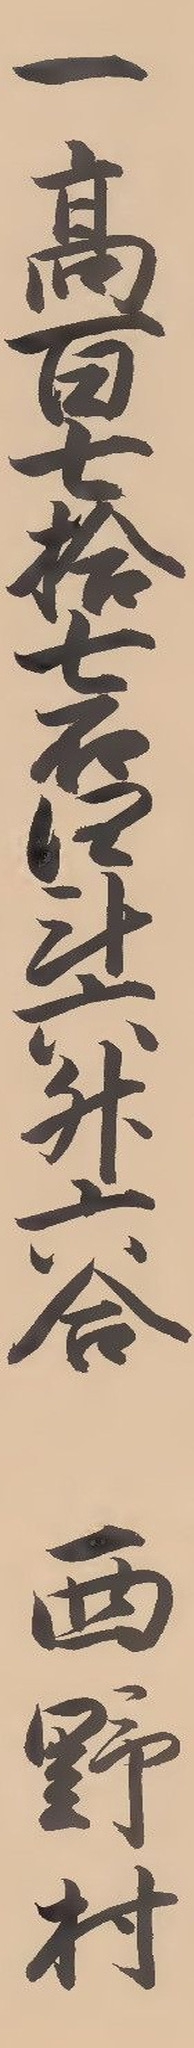一高百七拾七石四斗六升六合西野村
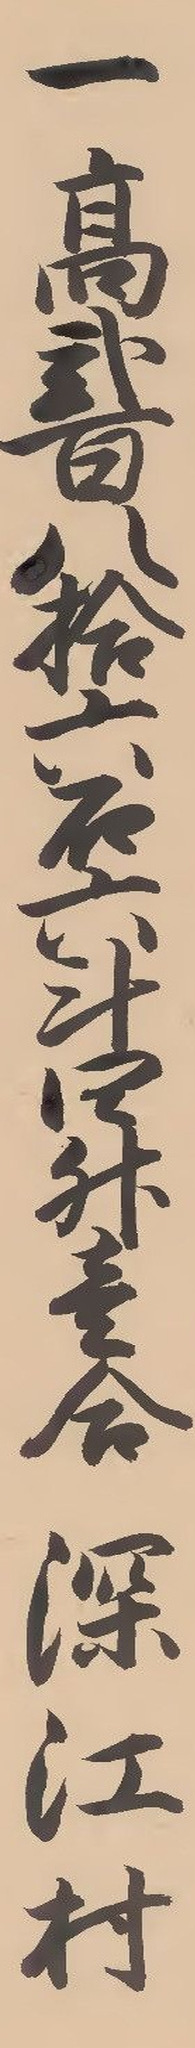一高弐百八拾六石六斗四升壱合深江村
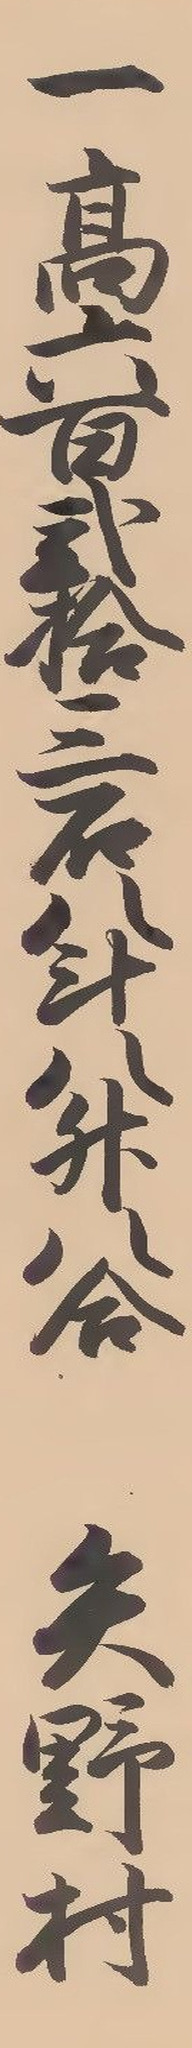一高六百弐拾三石八斗八升八合矢野村

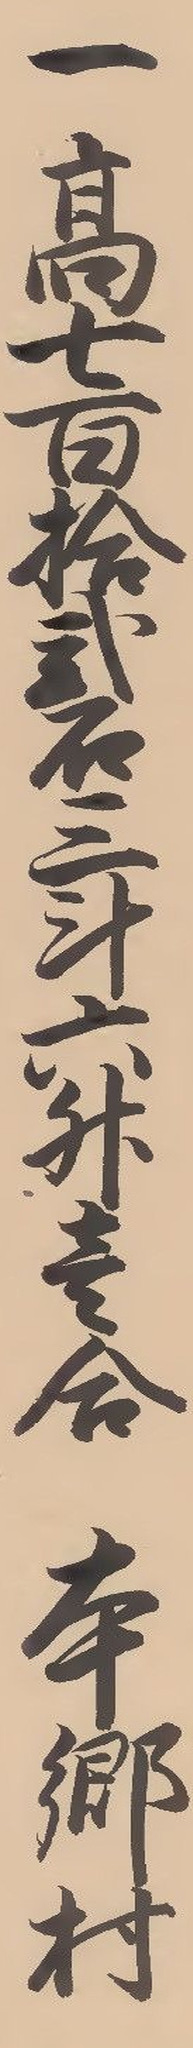一高七百拾弐石三斗六升壱合本郷村
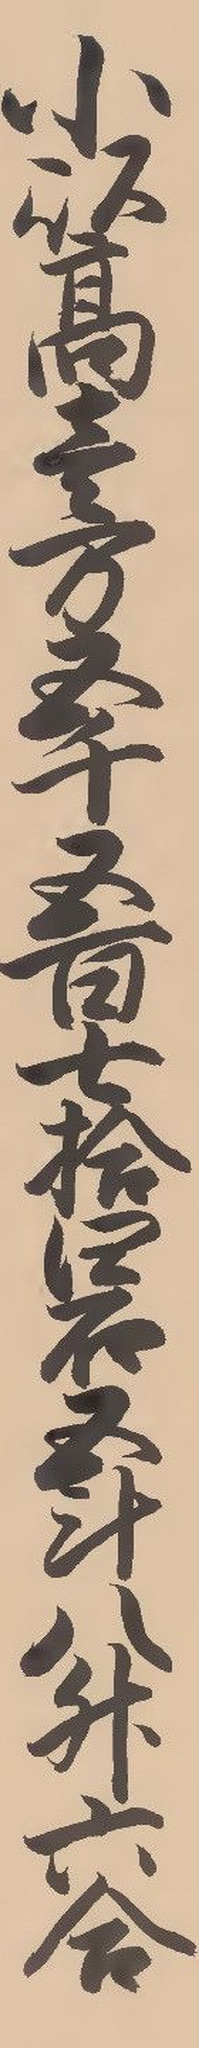小以高壱万五千五百七拾四石五斗八升六合
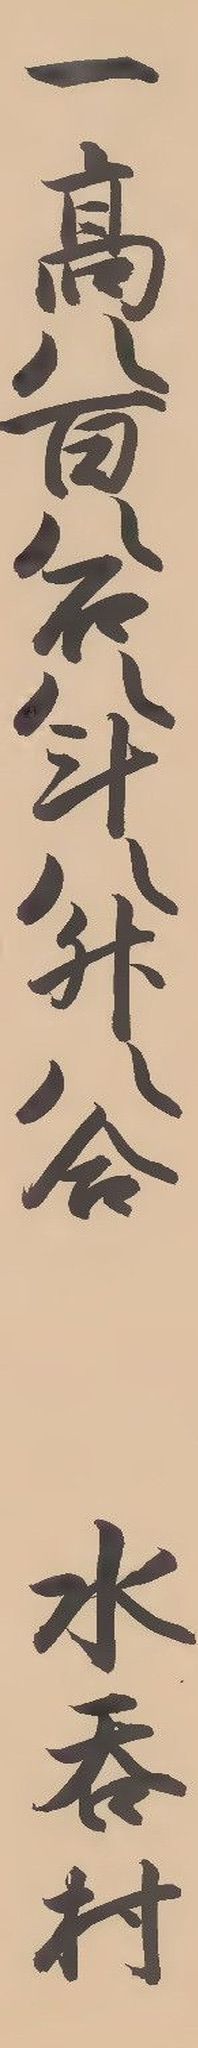一高八百八石八斗八升八合水呑村
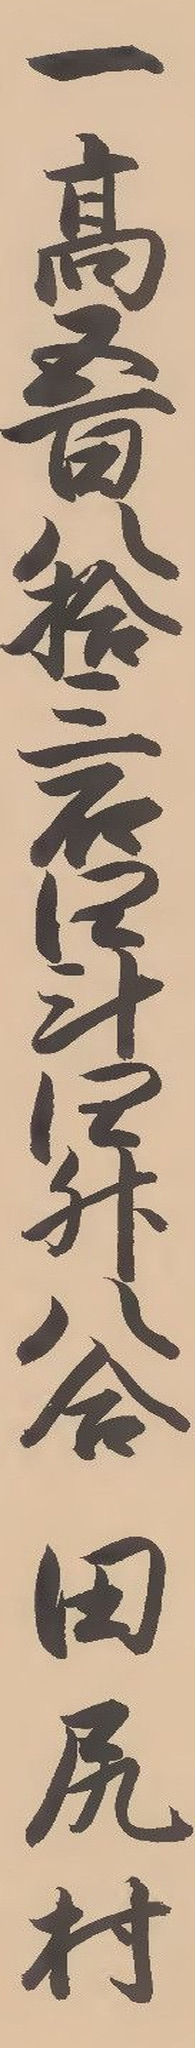一高五百八拾三石四斗四升八合田尻村
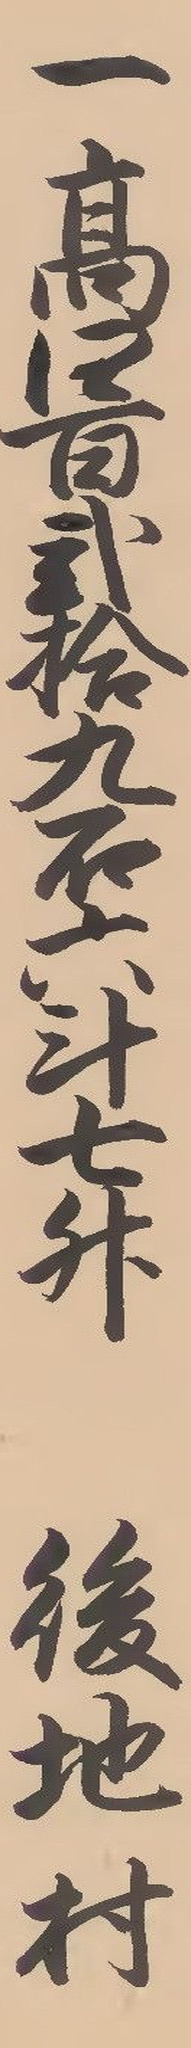一高四百弐拾九石六斗七升後地村

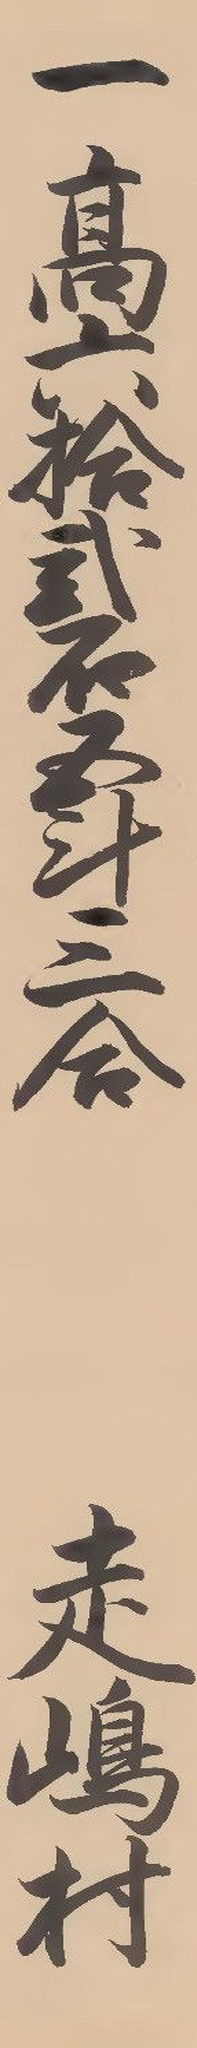一高六拾弐石五斗三合走島村
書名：備後国郷帳
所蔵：国立公文書館 National Archives of Japan
